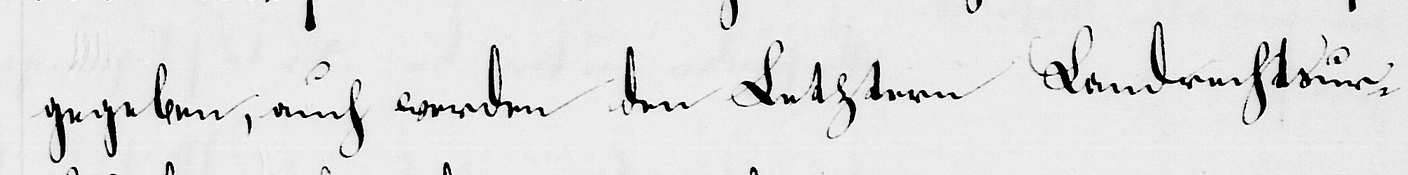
gegeben, auch werden den Letztern Landrechtsur¬
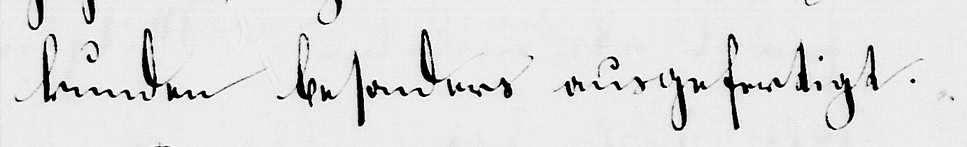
kunden besonders ausgefertigt.
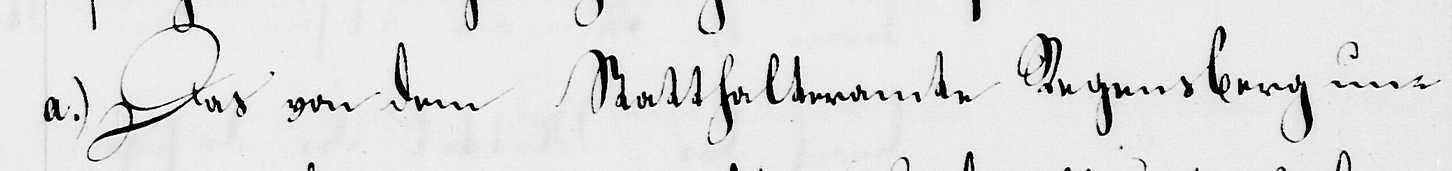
a.) Das von dem Statthalteramte Regensberg un¬
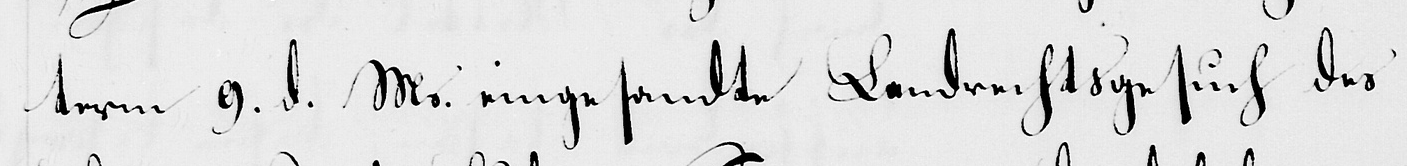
term 9. d. Ms. eingesandte Landrechtsgesuch des
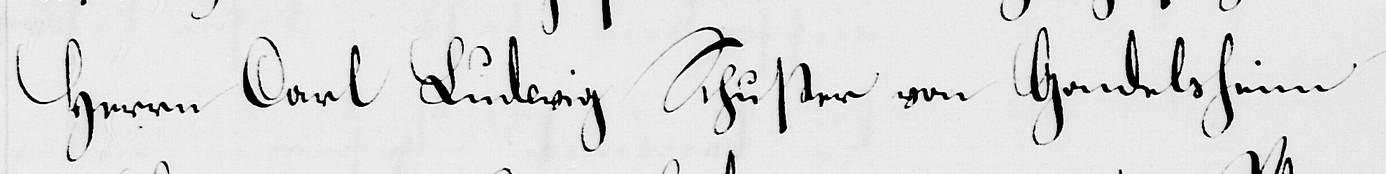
Herrn Carl Ludwig Schuster von Gondelsheim
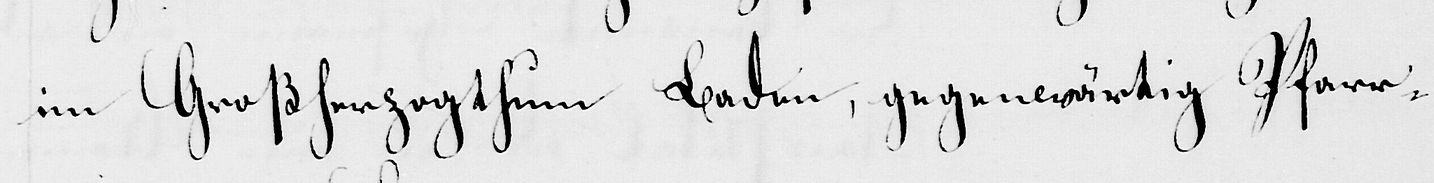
im Großherzogthum Baden, gegenwärtig Pfar¬
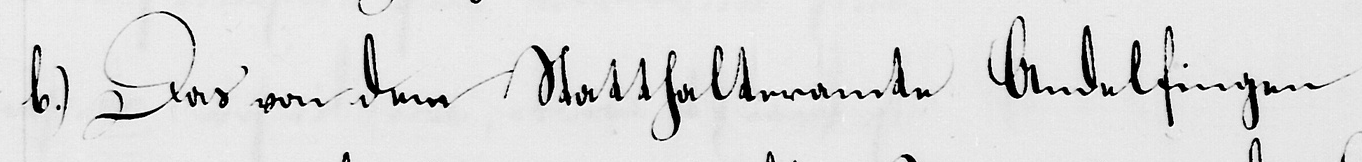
b.) Das von dem Statthalteramte Andelfingen
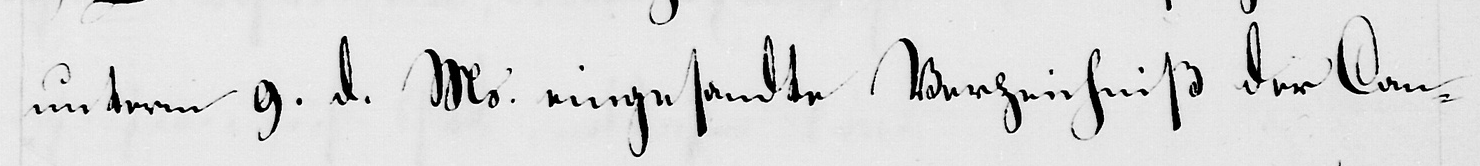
unterm 9. d. Ms. eingesandte Verzeichniß der Can-
